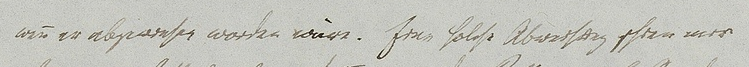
wenn er abgewiesen worden wäre. Eine solche Abweisung schien mir
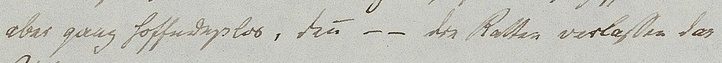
aber ganz hoffnungslos, denn – – die Ratten verlassen das
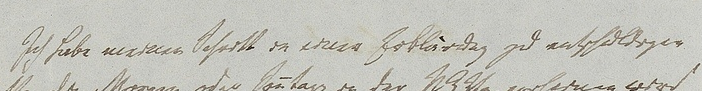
Ich habe meinen Schritt in einer Erklärung zu entschuldigen
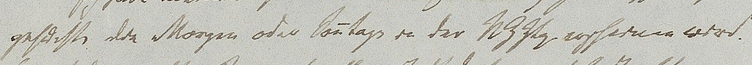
gesucht, die Morgen oder Sonntags in der NZZtg erscheinen wird.
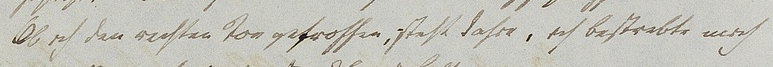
Ob ich den rechten Ton getroffen, steht dahin, ich bestrebte mich
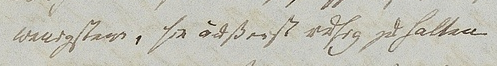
wenigstens, sie äußerst ruhig zu halten.
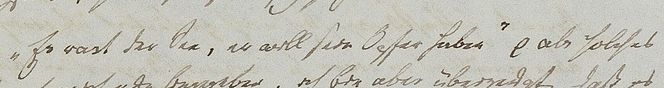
«Es rast der See, er will sein Opfer haben» & als solches
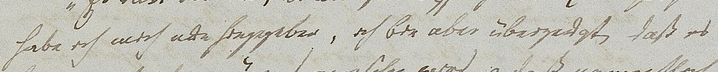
habe ich mich nun hingegeben, ich bin aber überzeugt, daß es
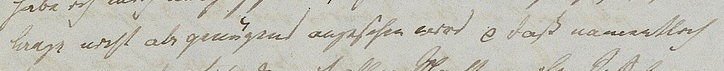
lange nicht als genügend angesehen wird & daß namentlich
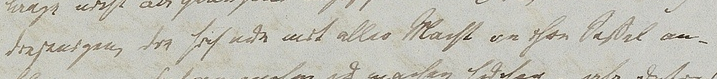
diejenigen, die sich nun mit aller Macht an ihre Sessel an-
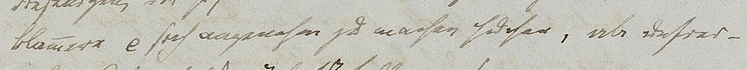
klammern & sich angenehm zu machen suchen, als unfrei-
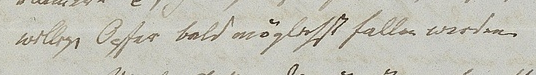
willige Opfer bald möglichst fallen werden.
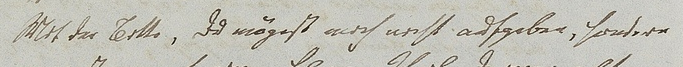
Mit der Bitte, Du mögest mich nicht aufgeben, sondern
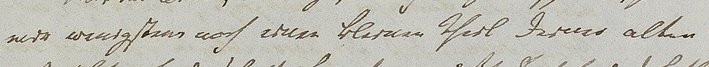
mir wenigstens noch einen kleinen Theil Deiner alten
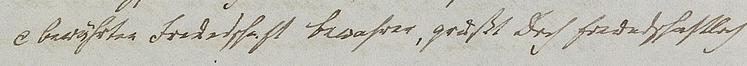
& bewährten Freundschaft bewahren, grüßt Dich freundschaftlich
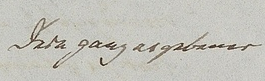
Dein ganz ergebener
